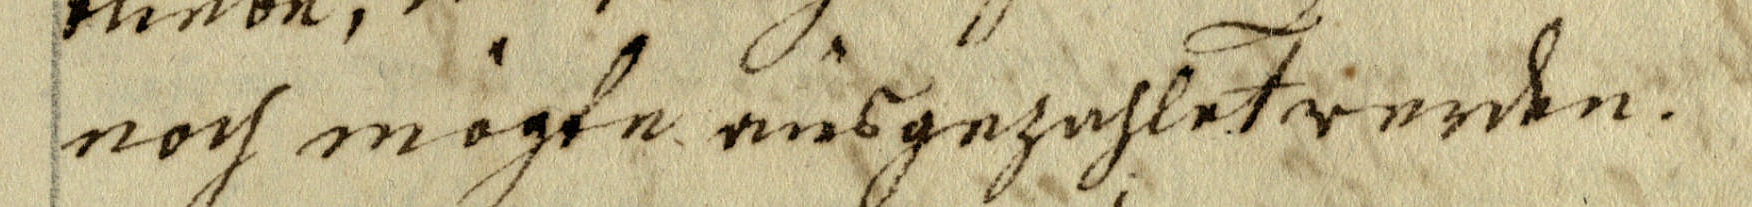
noch mögte ausgezahlet werden.
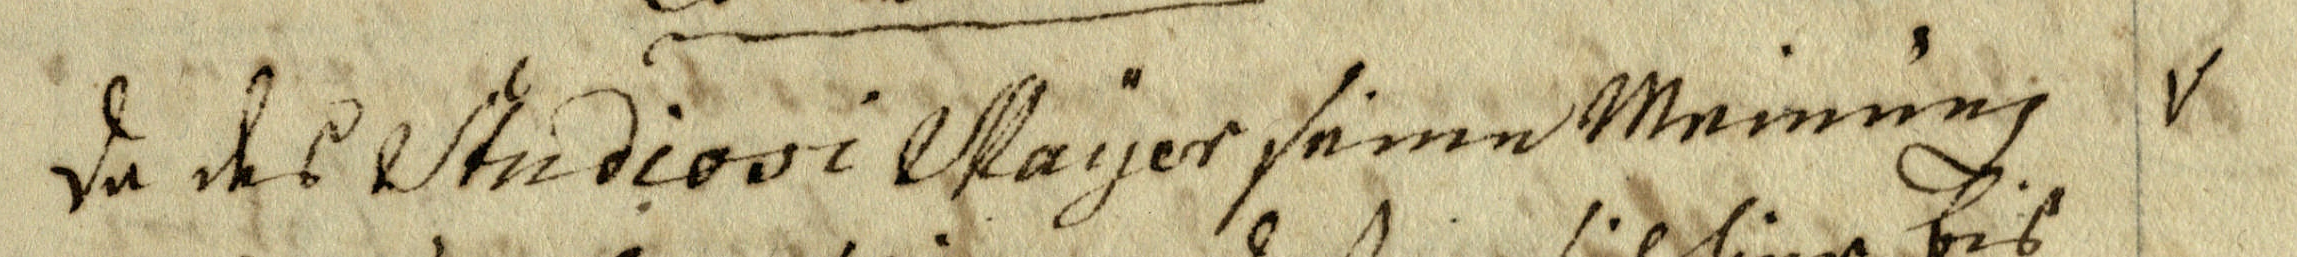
Da des Studiosi Maÿer seine Meinung
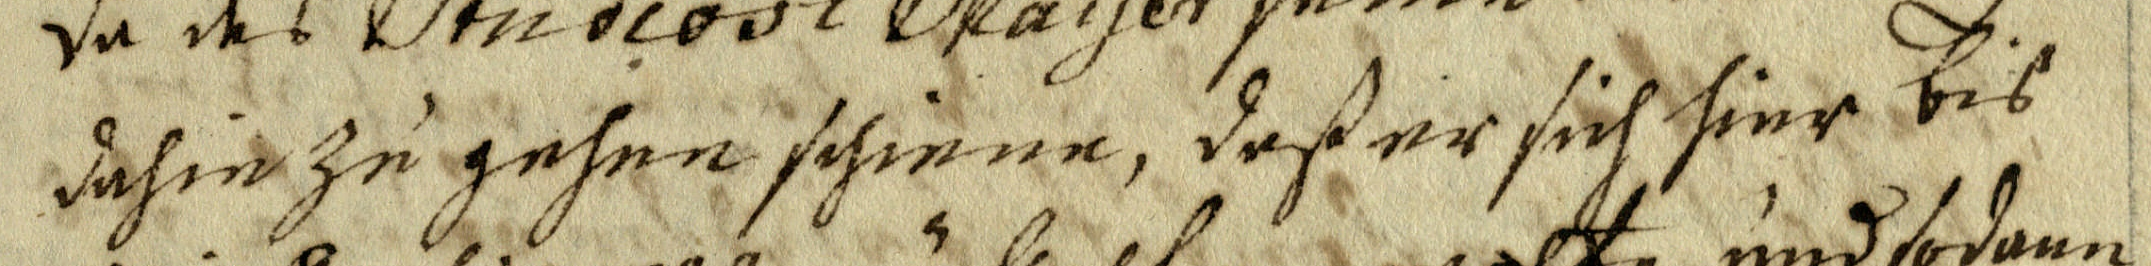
dahin zu gehen schiene, daß er sich hier bis
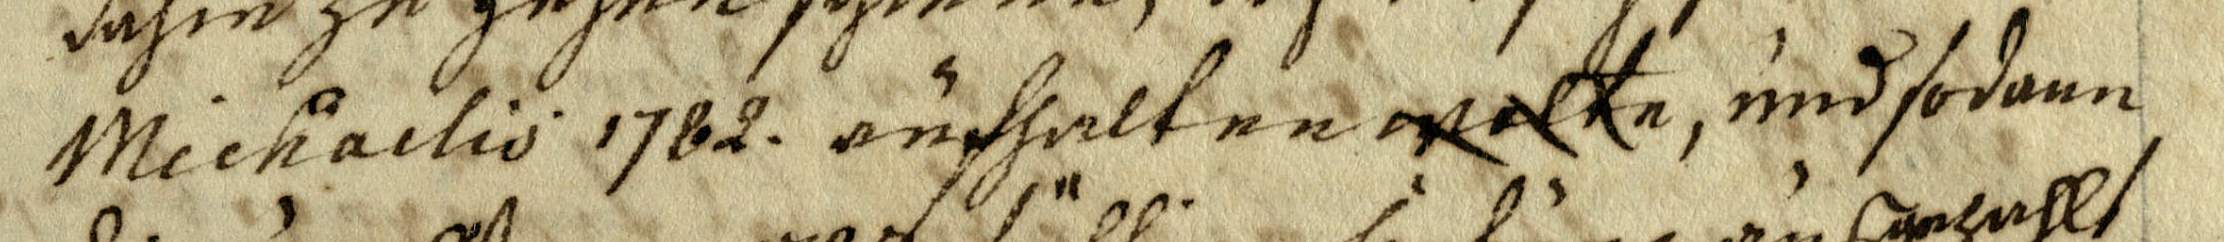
Michaelis 1782 . aufhalten, und sodann
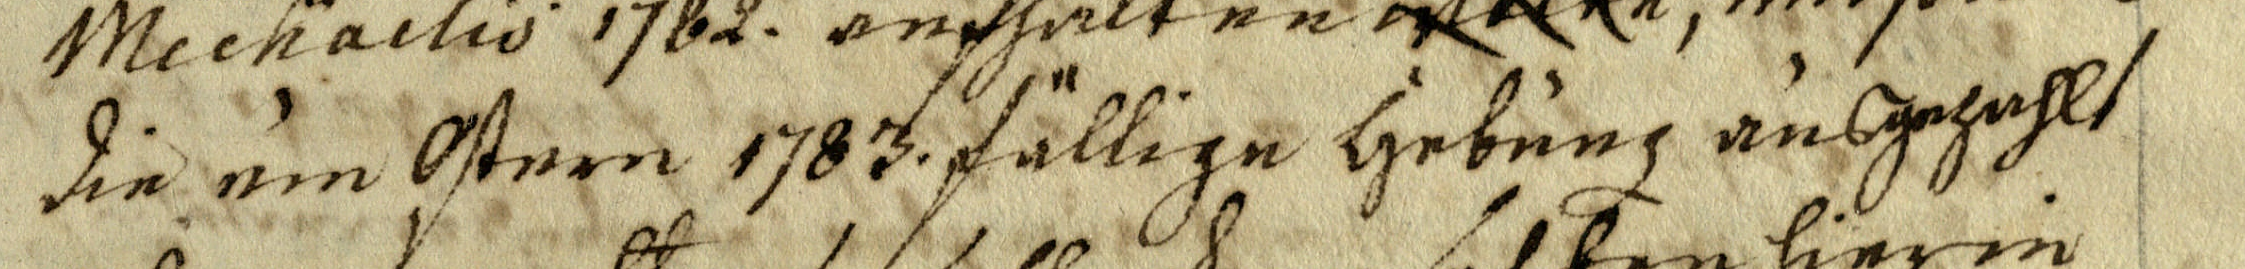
die um Ostern 1783. fällige Hebung ausgezahlt
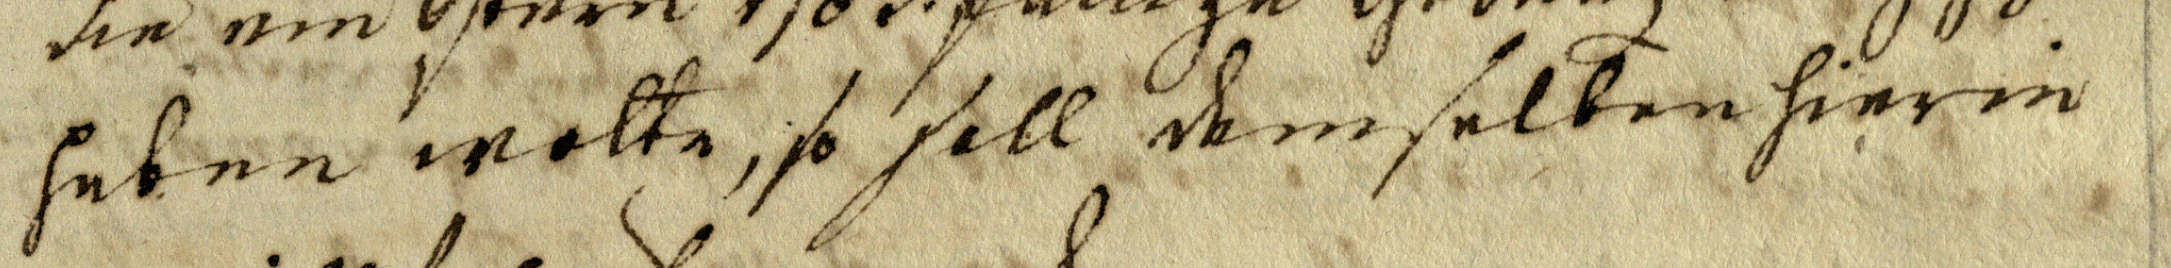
haben wolte, so soll dem selben hierin
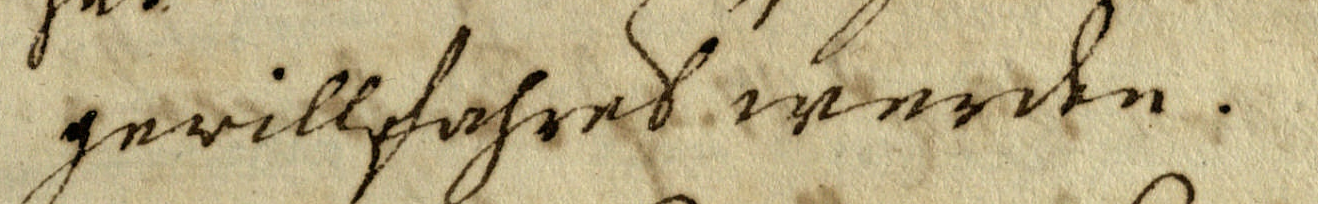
gewillfahret werden.
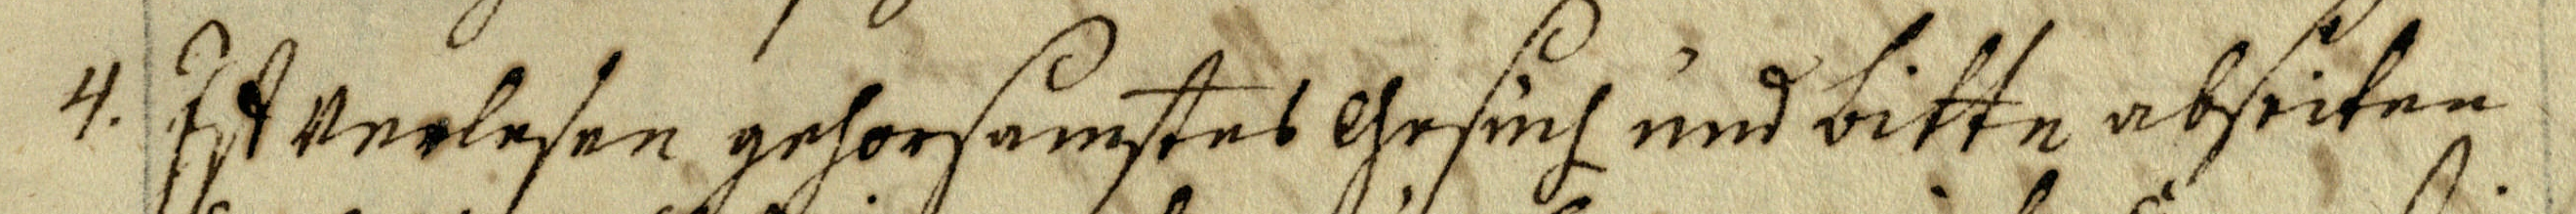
4. Ist verlesen, gehorsamstes Gesuch und Bitte abseiten
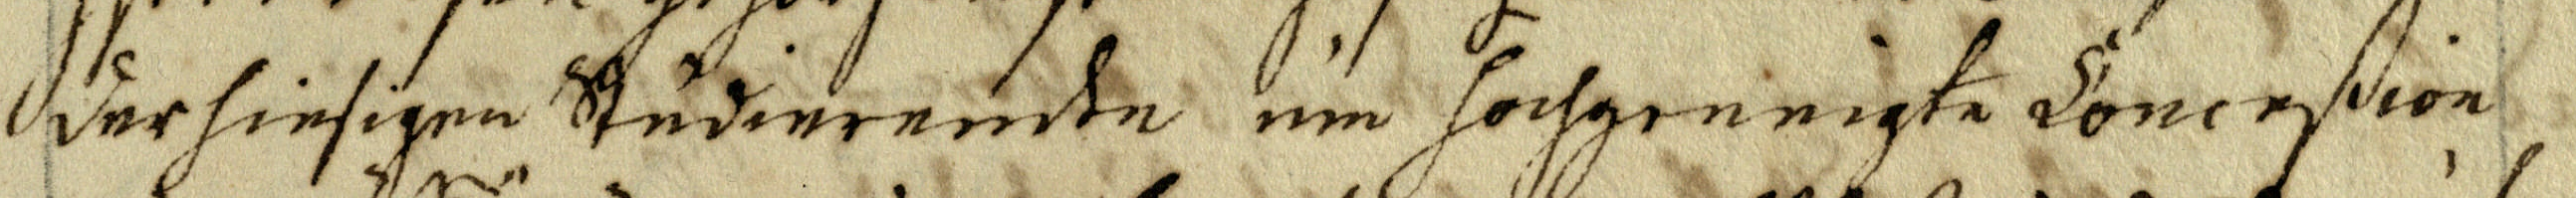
der hiesigen Studierenden um hochgeneigte Conceßion
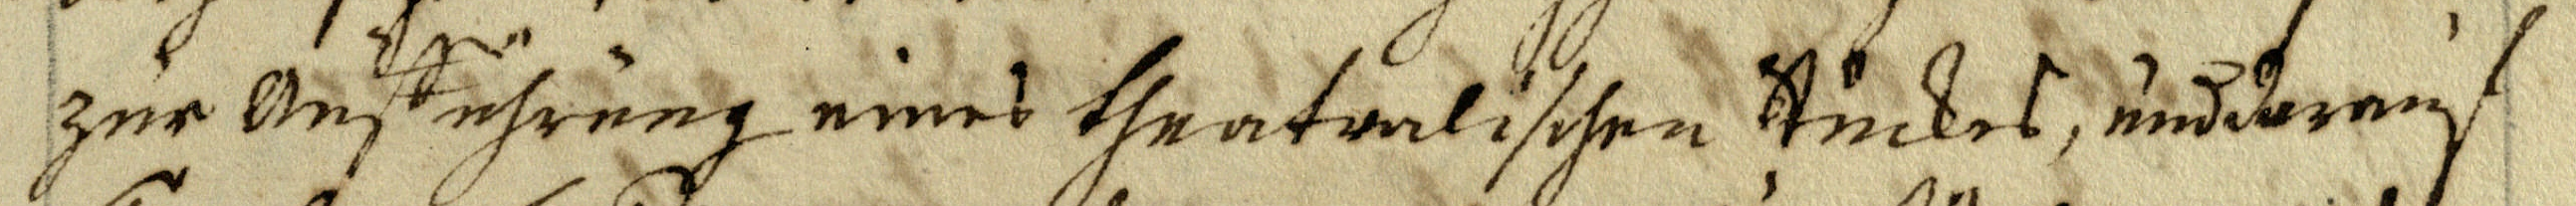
zur Aufführung eines theatralischen Stückes, und darauf
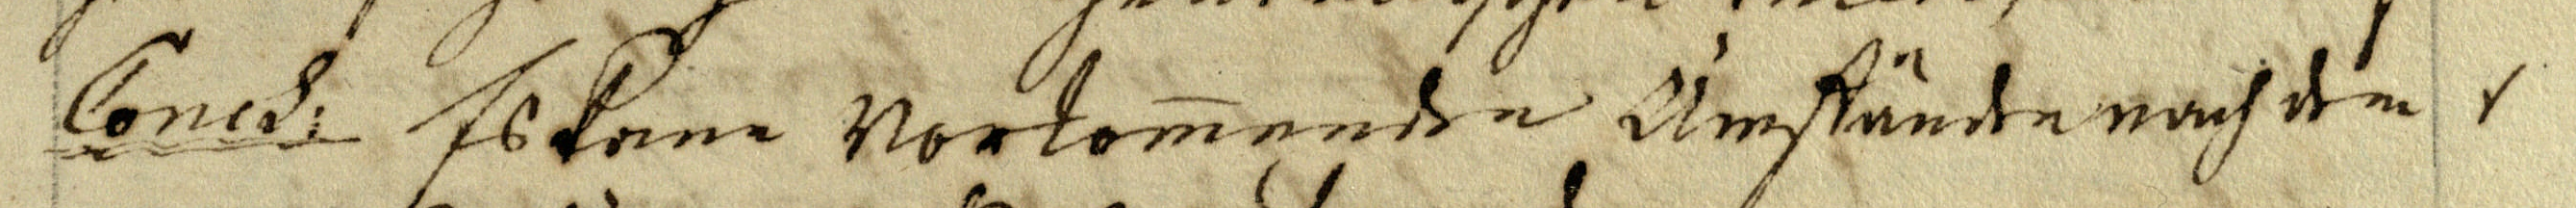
Concl. Es kann vorkomenden Umständen nach dem
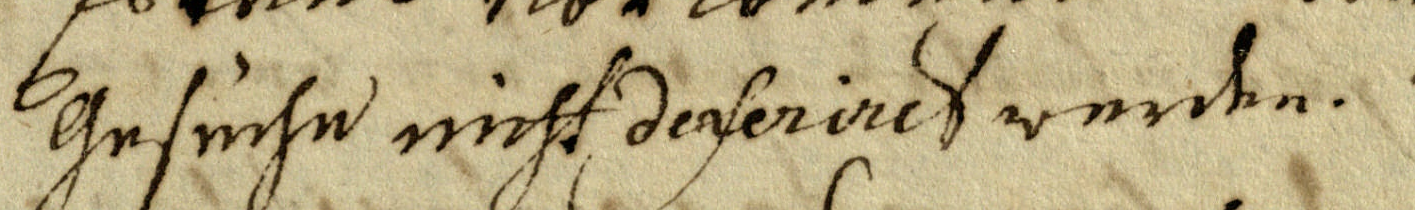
Gesuche nicht deferiret werden.
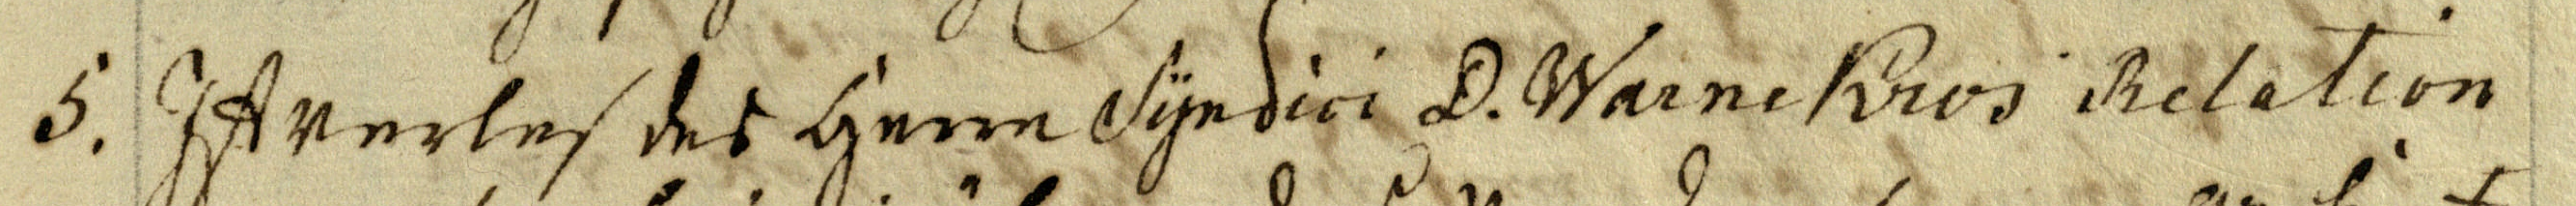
5. Ist verles des Herrn Sÿndici D. Warnekros Relation
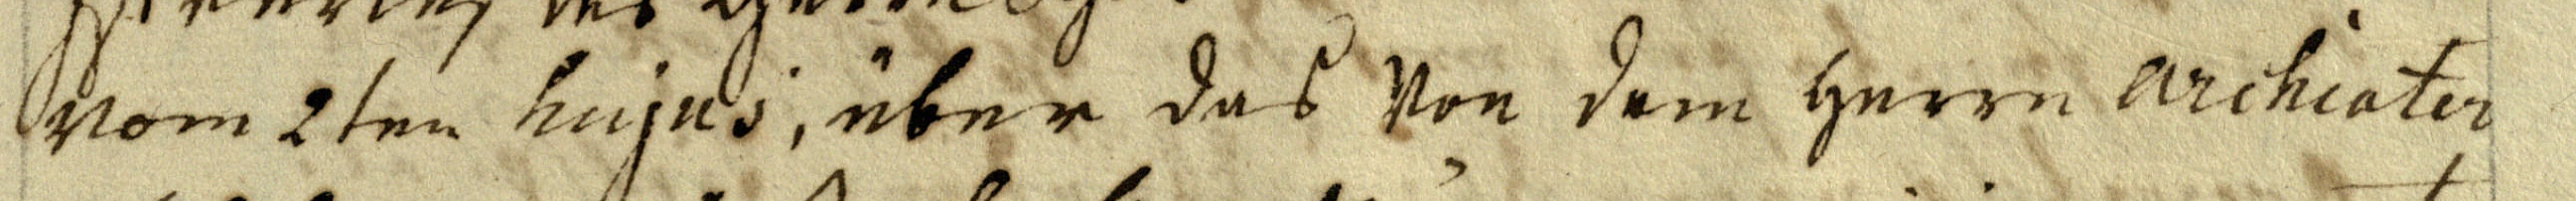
vom 2ten hujus, über das von dem Herrn Archiater
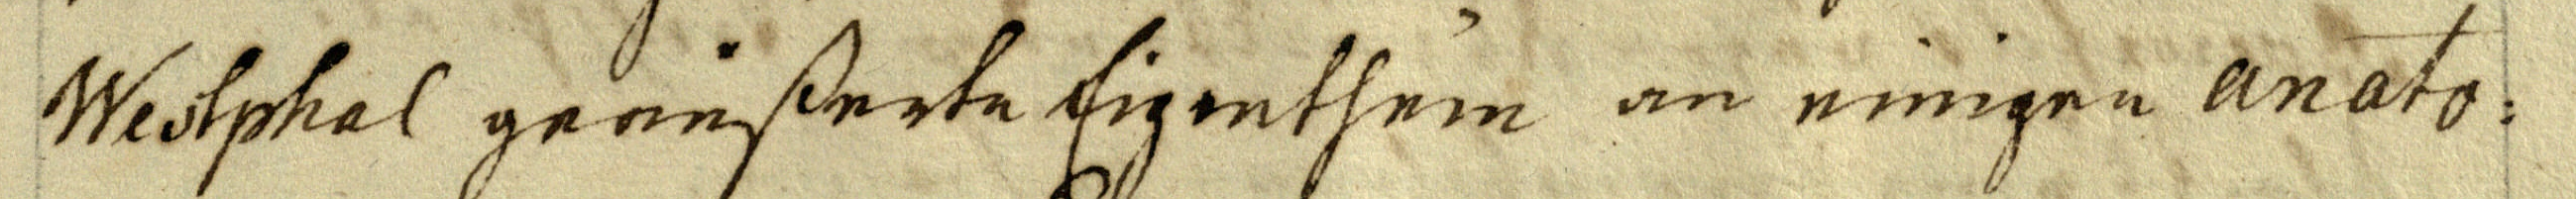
Westphal geäußerte Eigenthum an einigen anato¬
